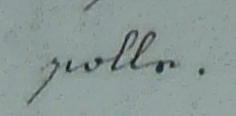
solle.
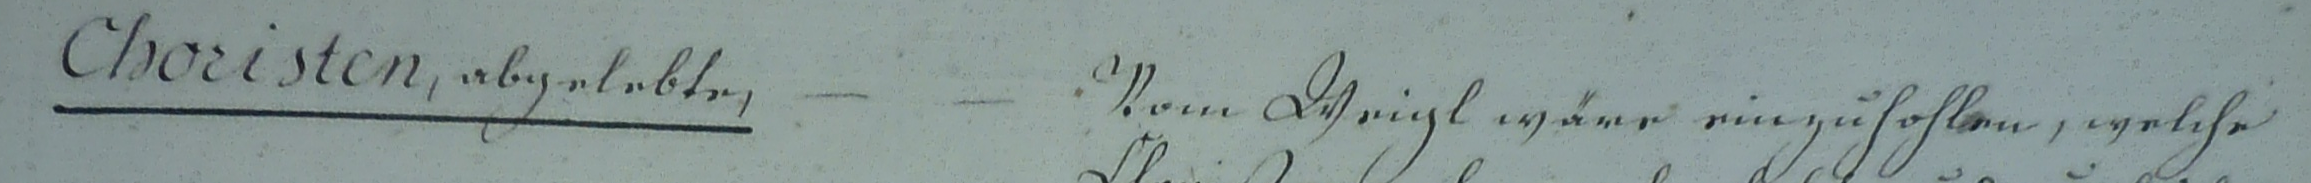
Choristen, abgelebte, _ _ Vom Weigl wäre einzuhohlen, welche
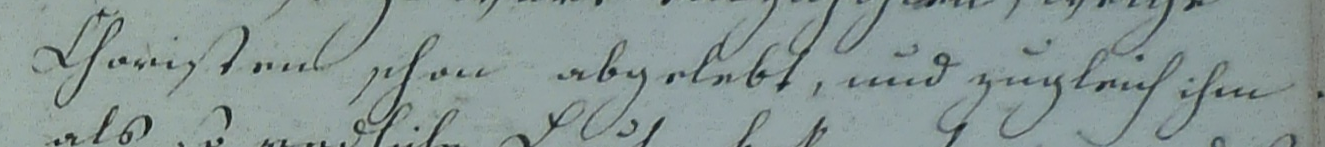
Choristen schon abgelebt, und zugleich ihm
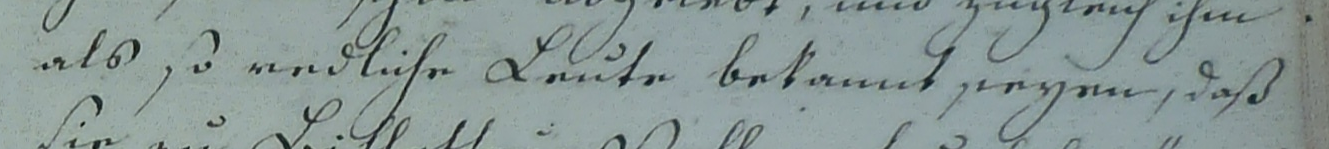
als so redliche Leute bekannt seyen, daß
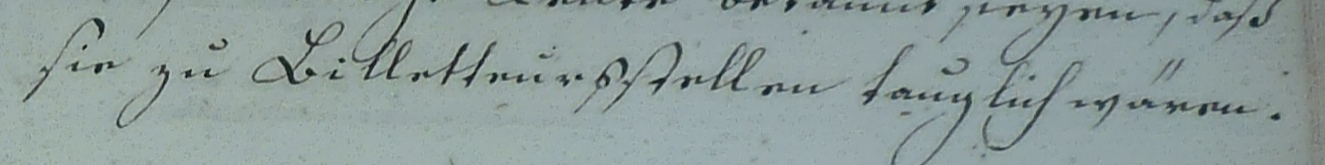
sie zu Billetteursstellen tauglich wären.
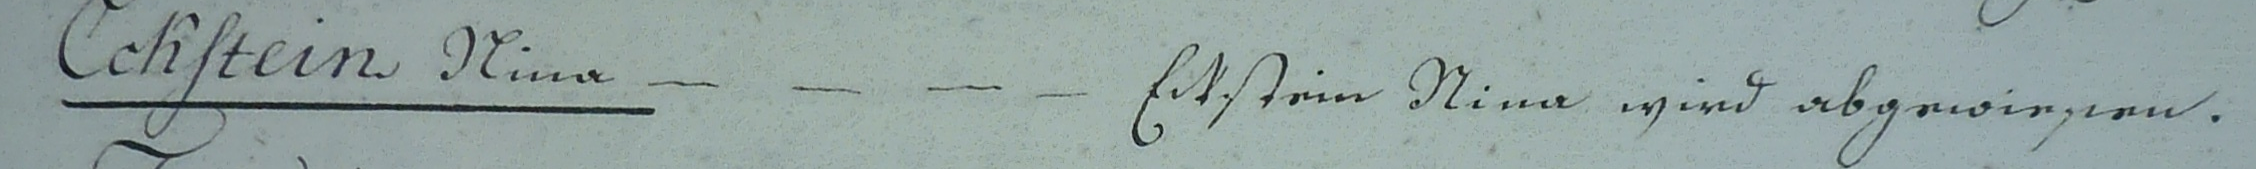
Eckstein Nina _ _ _ _ Eckstein Nina wird abgewiesen.
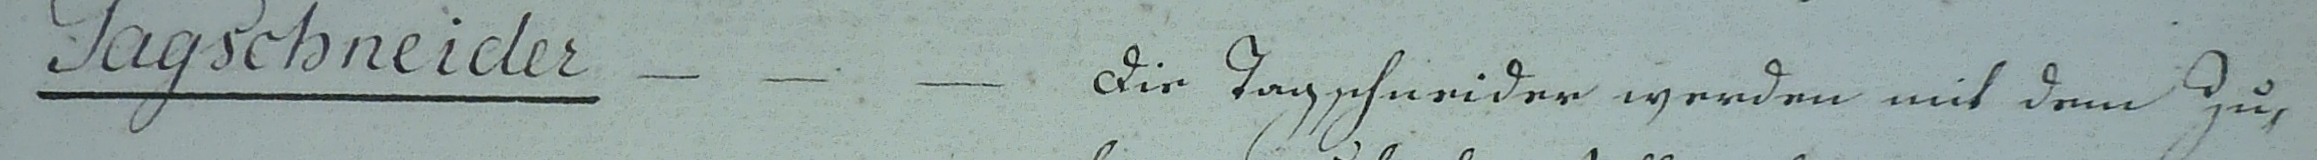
Tagschneider _ _ _ Die Tagschneider werden mit dem Zu¬
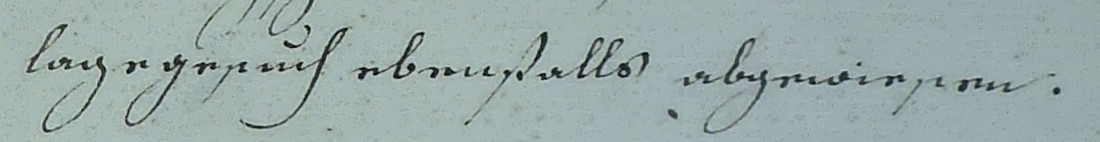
lagegesuch ebenfalls abgewiesen.
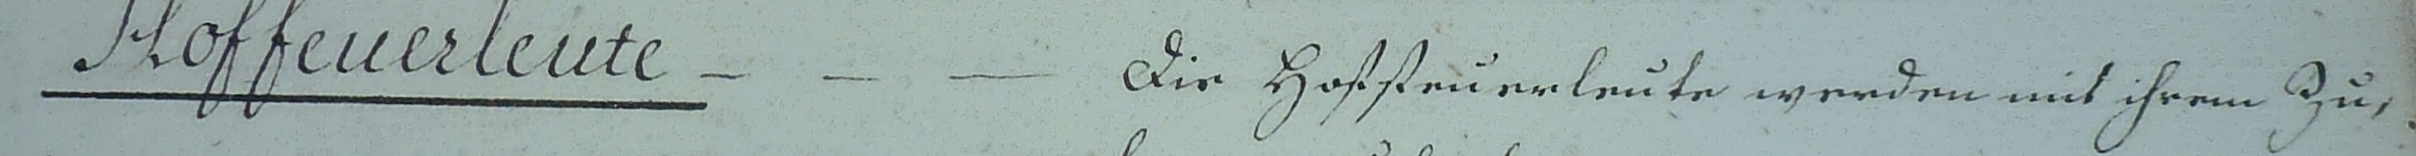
Hoffeuerleute _ _ _ Die Hoffeuerleute werden mit ihrem Zu¬
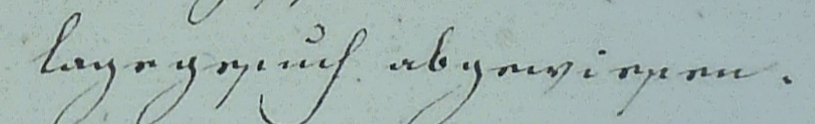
lagegesuch abgewiesen.
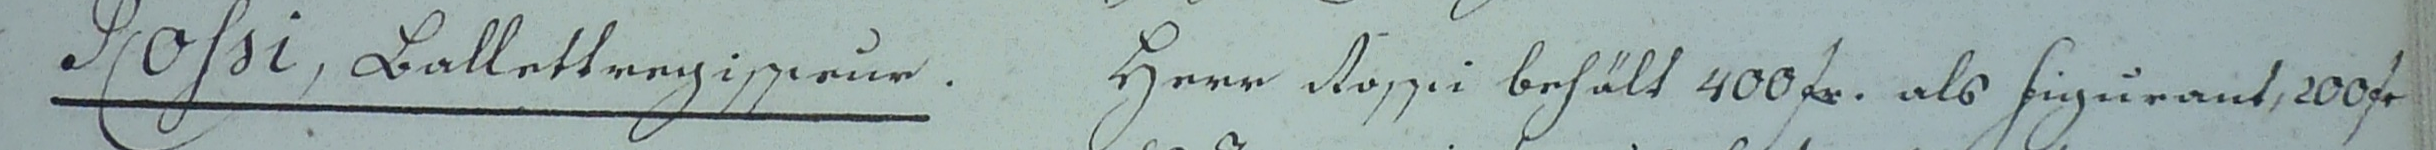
Rossi, Ballettregisseur. Herr Rossi behält 400 fr. als Figurant, 200fr
